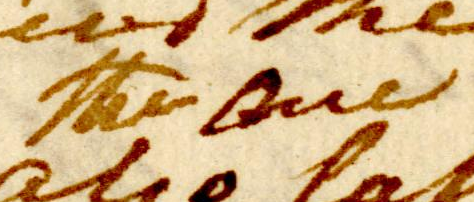the one
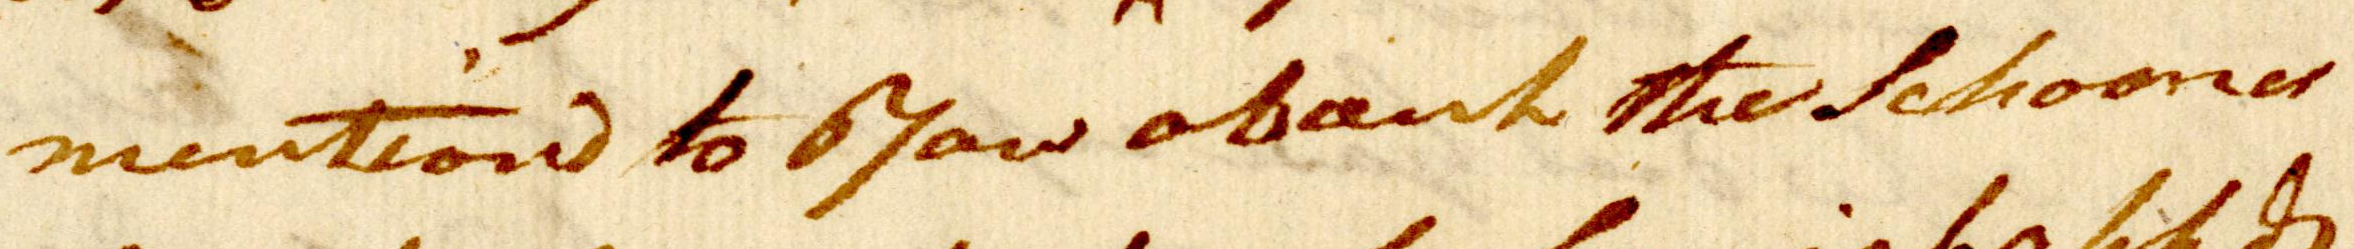mentiond to you about the Schooner
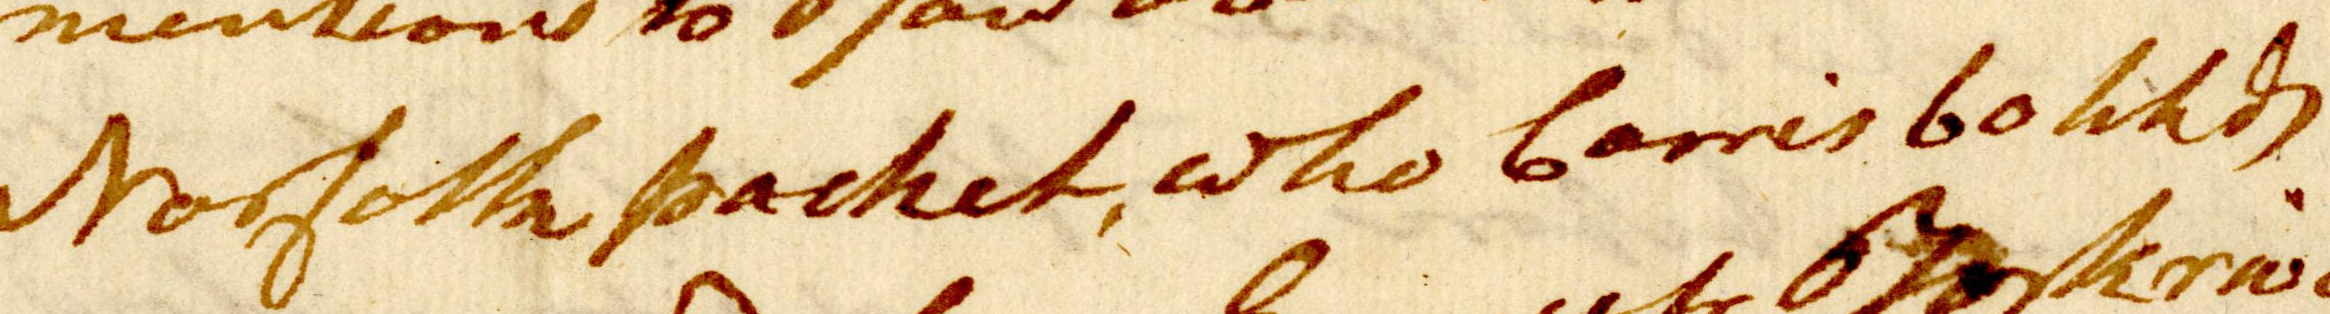Norfolk packet, who Carries 60 hhds
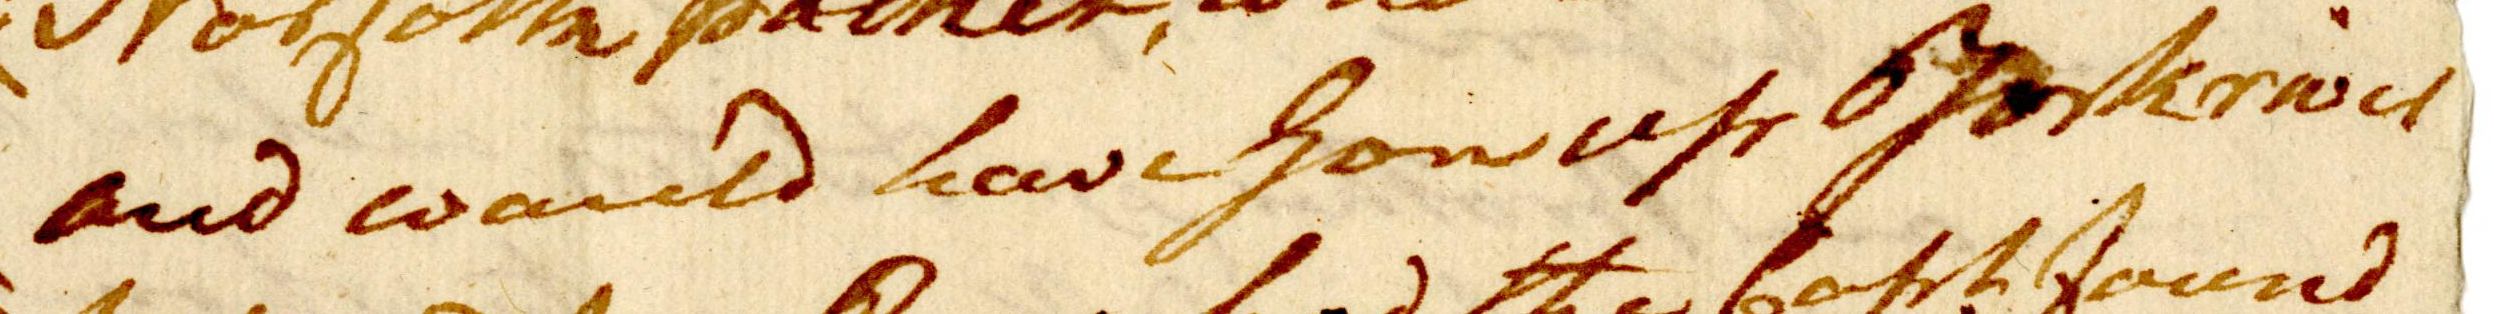and would have Gon up York River
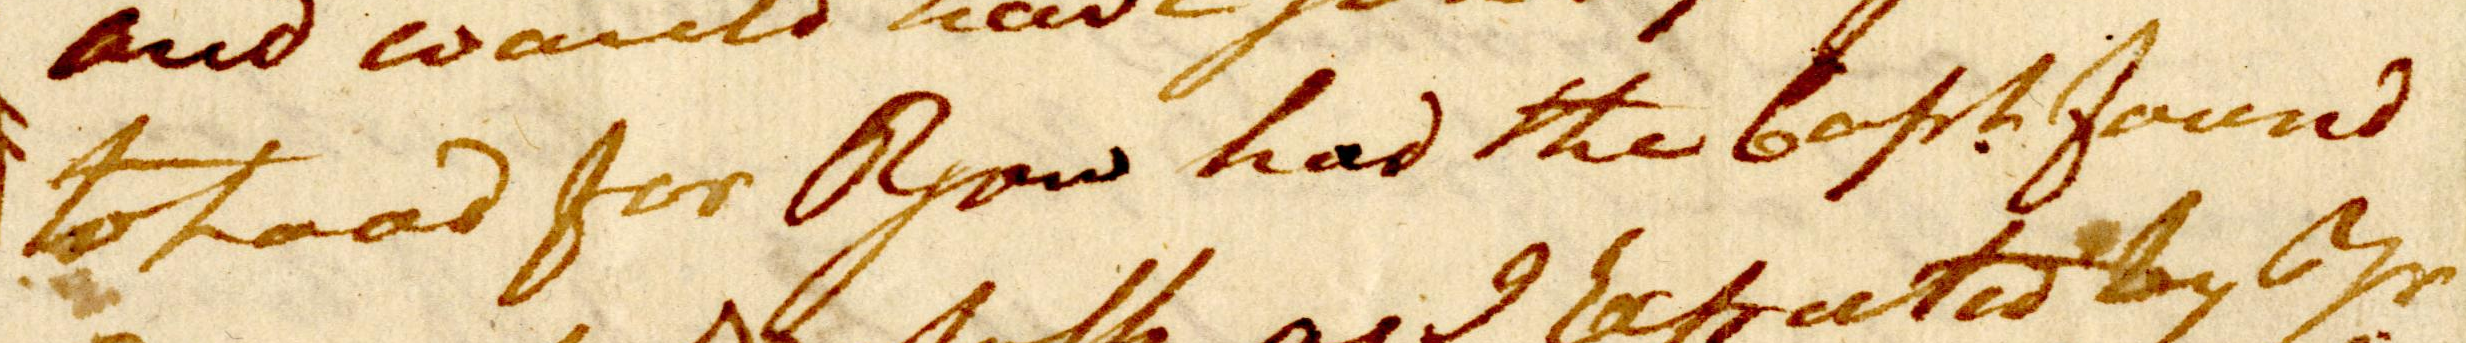to Load for you had the Cap^t found
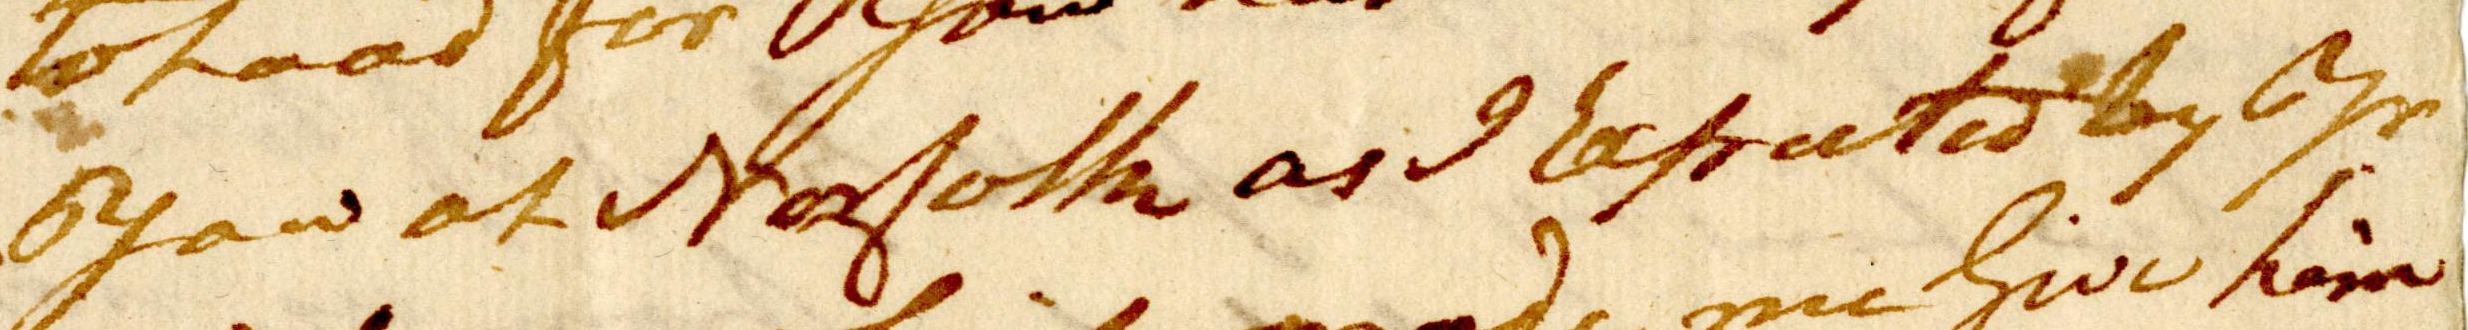you at Norfolk as I expected by y^r
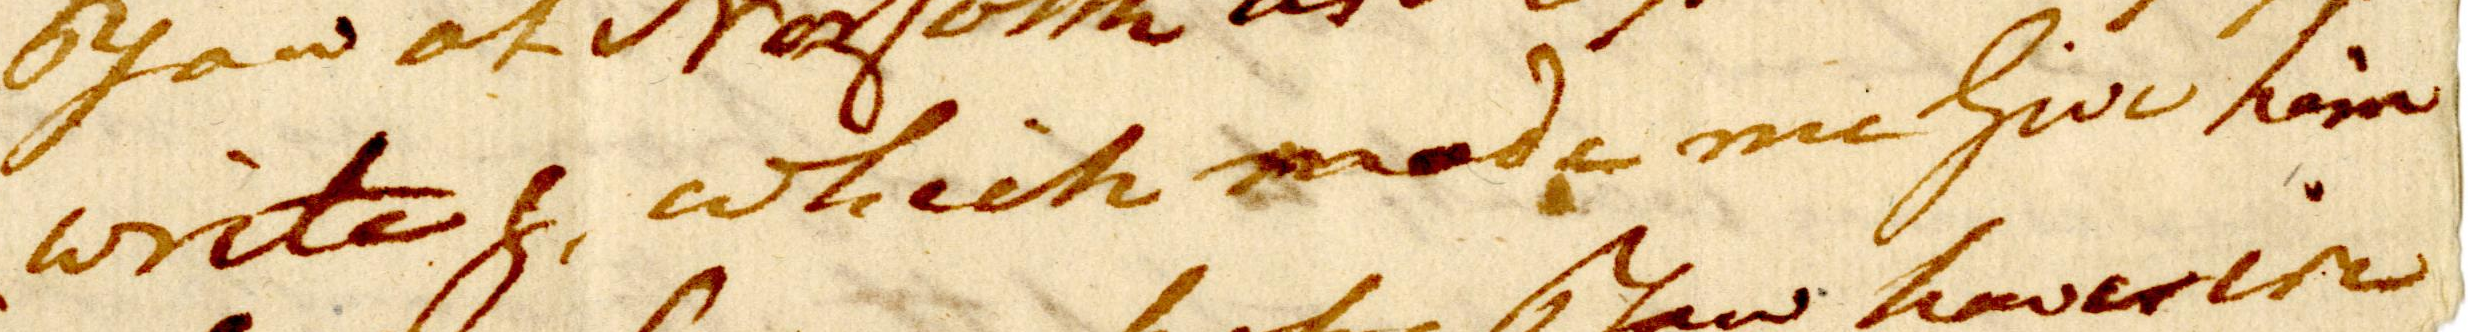write'g which made me Give him
